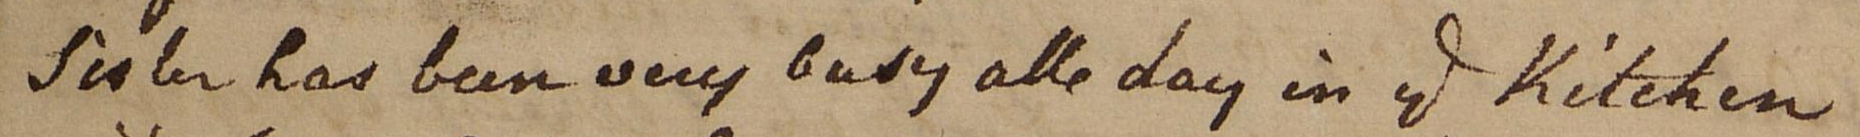Sisler has been very busy all day in y^e Kitchen
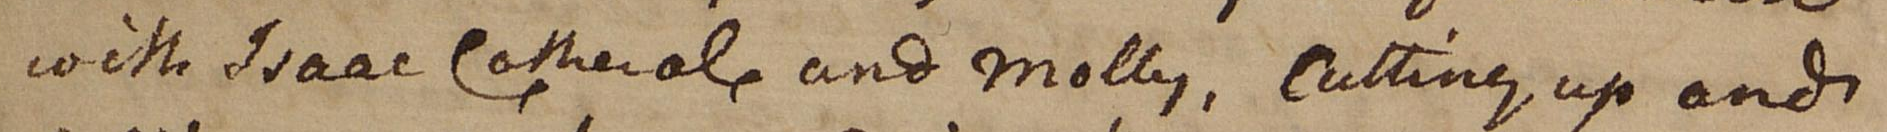with Isaac Catheral, and Molly, Cutting up and
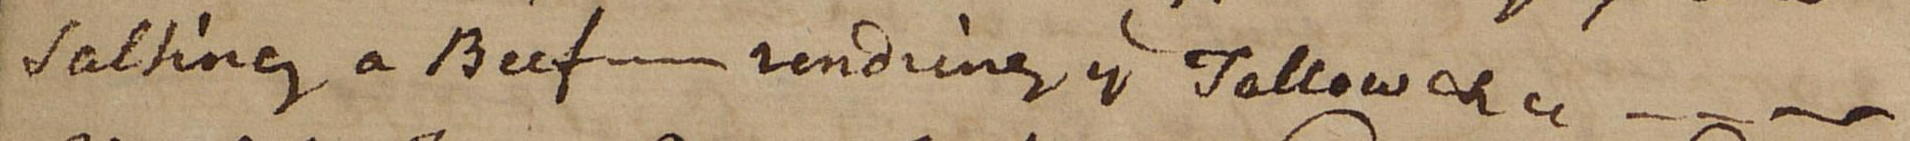Salting a Beef- rending y^e Tallow &c---
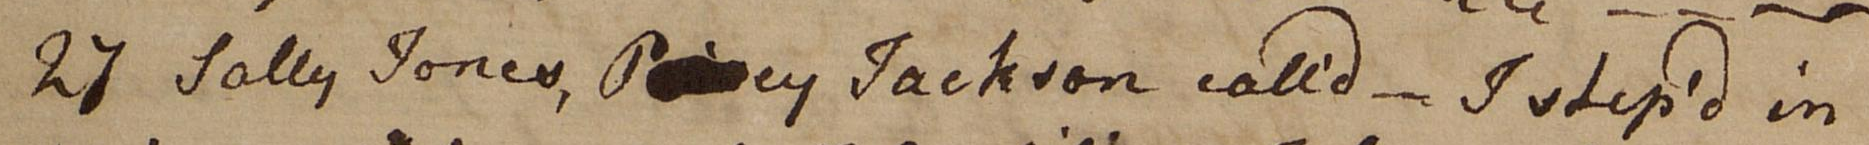27 Sally Jones, P[__]ey Jackson call'd- I step'd in
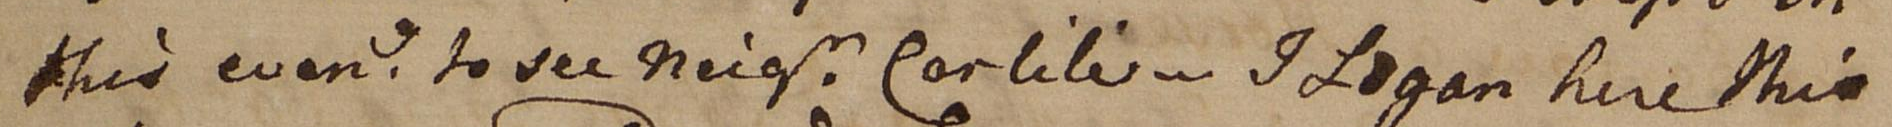this even^g. to see Neig^r. Carlili- I Logan here this
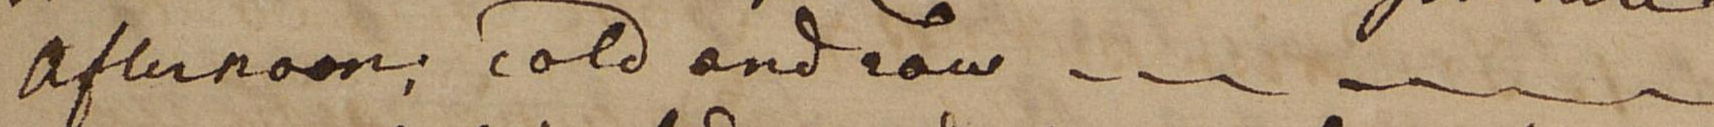Afternoon; cold and raw-- -
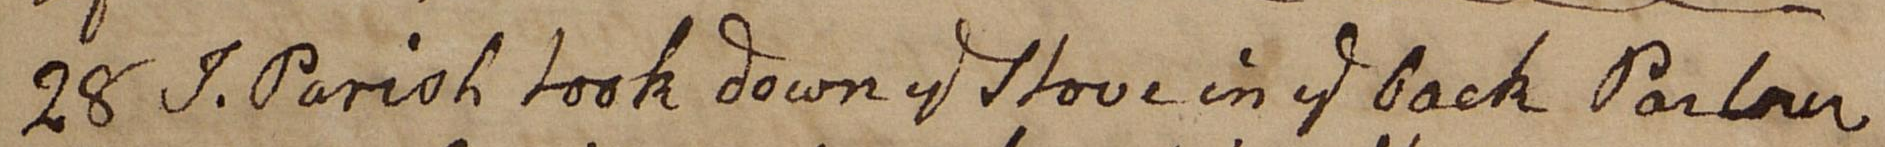28 I. Parish took down y^e Stove in y^e back Parlour
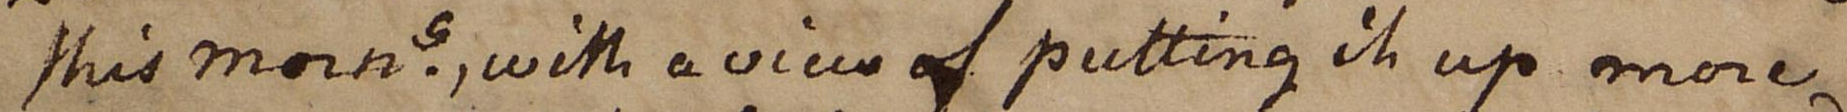this morn^g., with a view of putting it up more
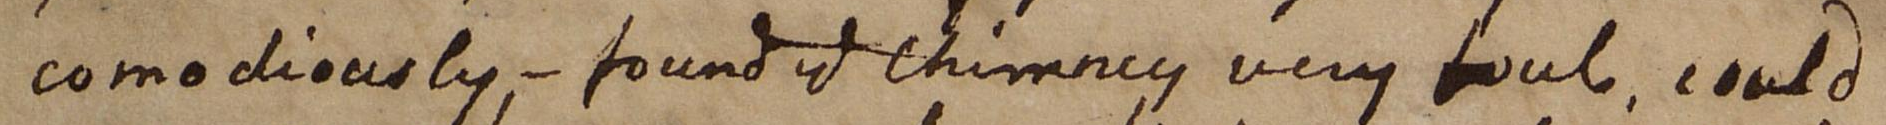comodicusly,- found y^e chimney very foul, could
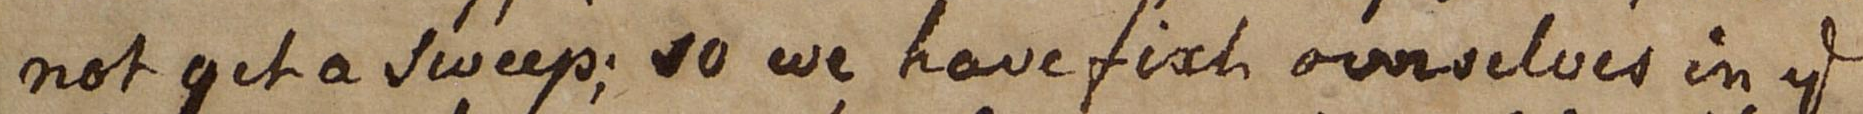not get a Sweep; so we have fixt ourselves in y^e
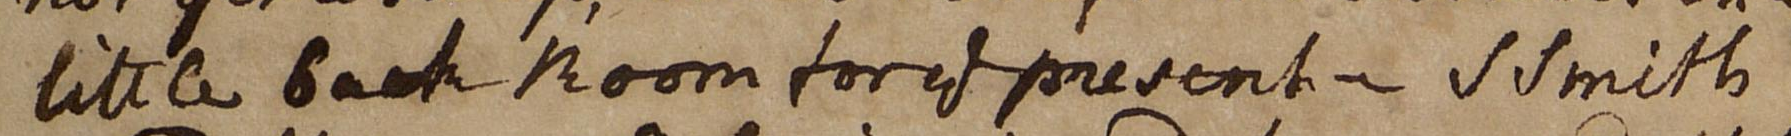little back Room for y^e present- S Smith
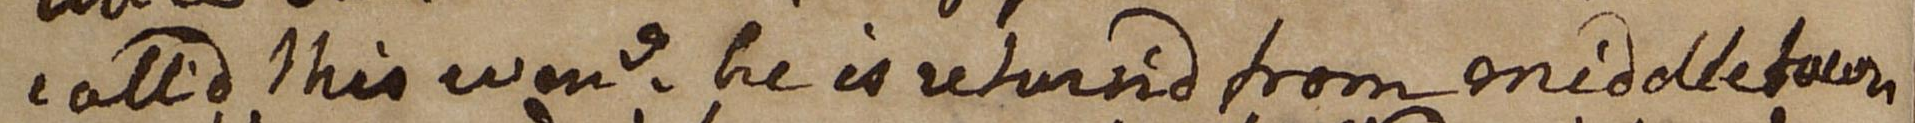call'd this even^g. he is return'd from middletown
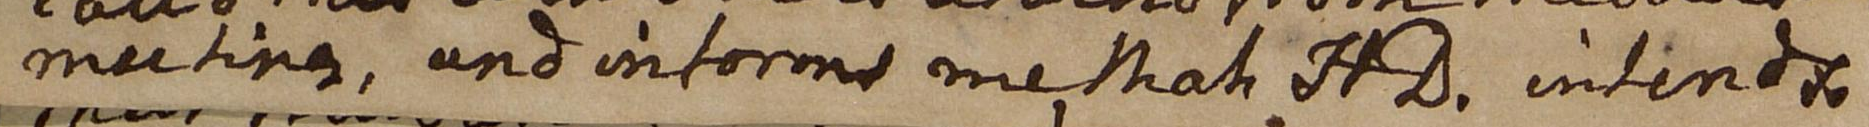meeting, and informs me that HD. intends
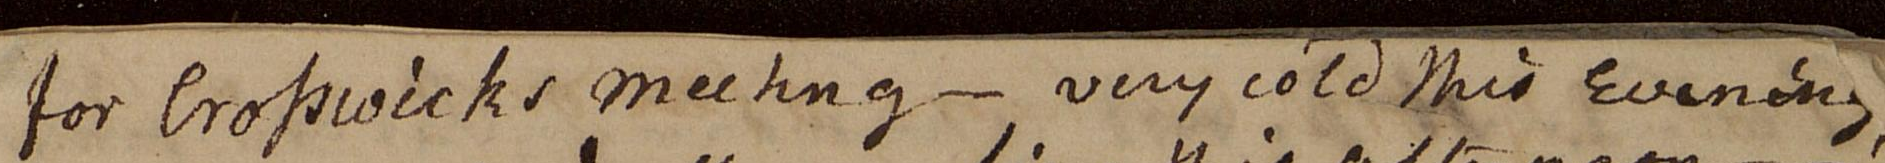for Crosswicks Meeting- very cold this Evening,
